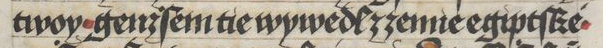twoy.genżſem tie wywedl z zemie egiptſké.
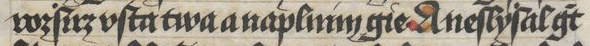rozẛirz vſta twa a naplnim gie.A neſlyẛal ḡt
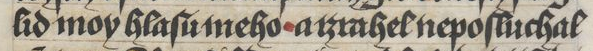lid moy hlaſu meho.a izrahel nepoſluchal
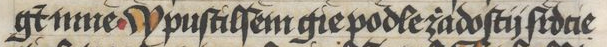ḡt mne.Y puſtilſem gie podle żadoſtij ſrdcie
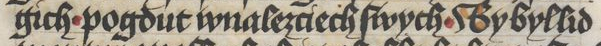gich.pogdut wnalezciech ſwych.By byl lid
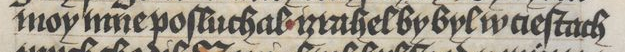moy mne poſluchal.izrahel by byl w cieſtach
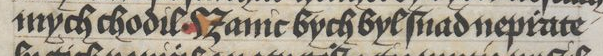mych chodil.Zanic bych byl ſnad nepṙate¬
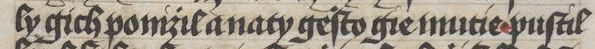ly gich pomżil a naty geẛto gie mutie.puſtil
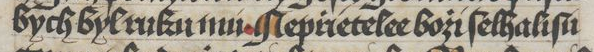bych byl ruku mú.Nepṙietelee bożí ſelhaliſu
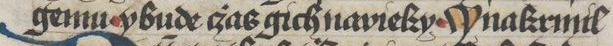gemu.y bude cżas gich navieky.Ynakrmil
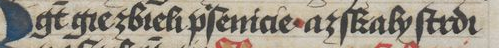ḡt gie zbieli pẛenicie.a zkaly ſtrdi
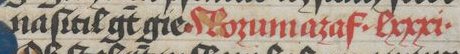naſitil ḡt gie.Rozum azaf.lxxxi.
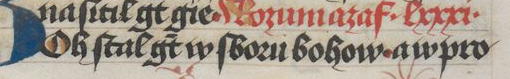Oh ſtal ḡt w ſboru bohow.a w pro¬
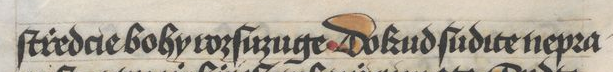ſtṙedcie bohy rozſuzuge.Dokud ſudite nepra¬
